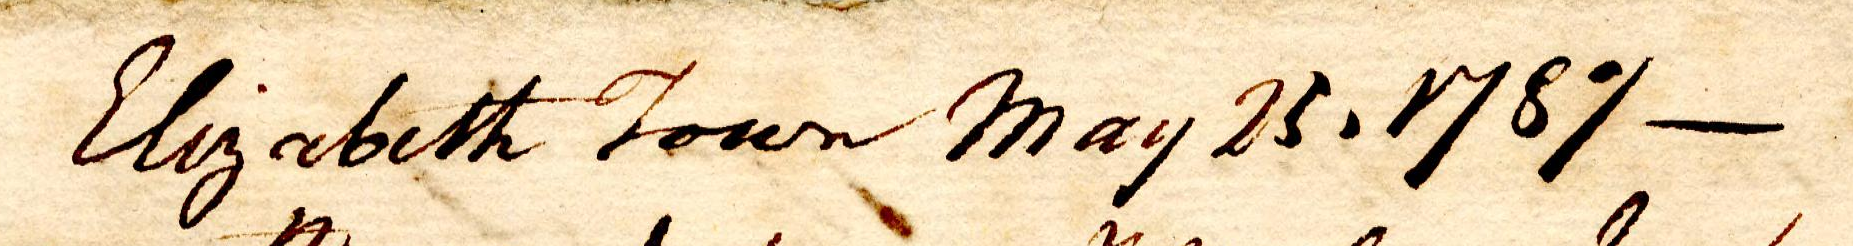Elizabeth Town May 25. 1787.-
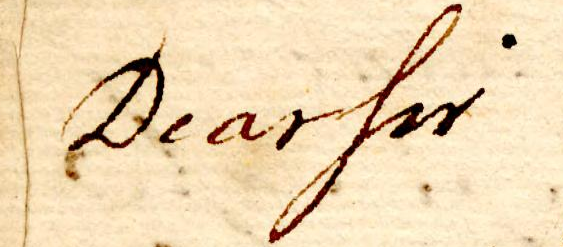Dear sir
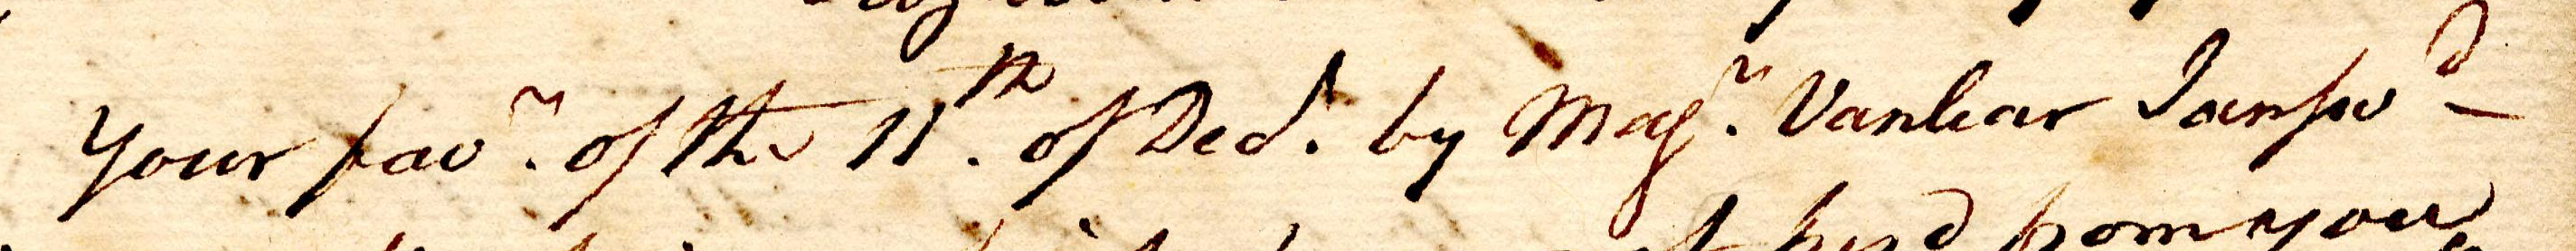Your fav^r. of the 11^th. of Dec^r. by Maj^r. Vanlear I answ^d-
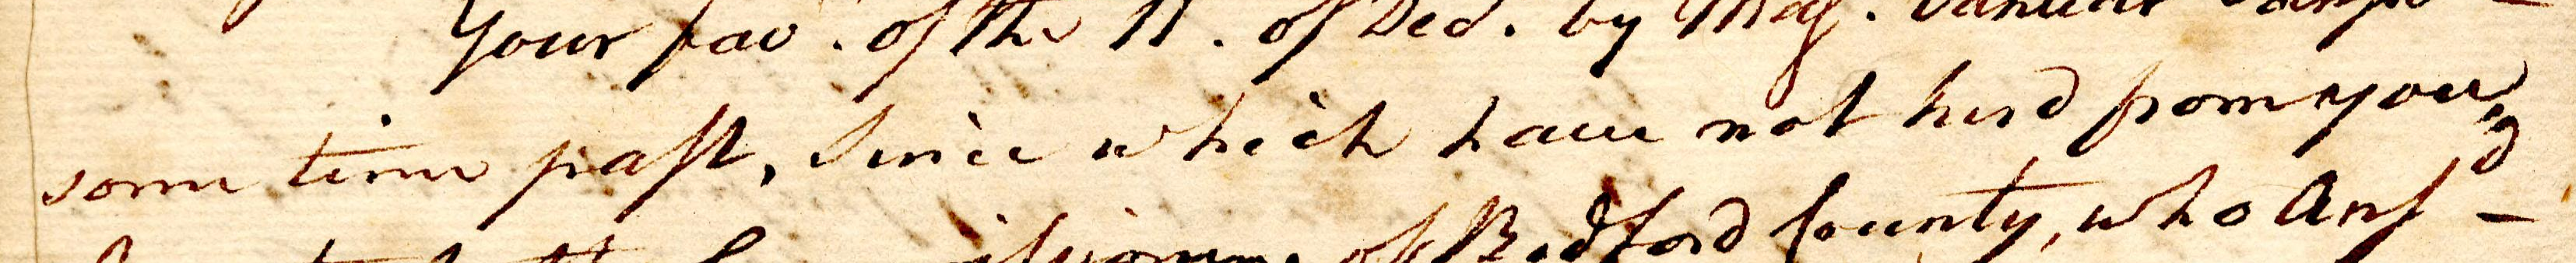some time past, Since which have not herd from you,
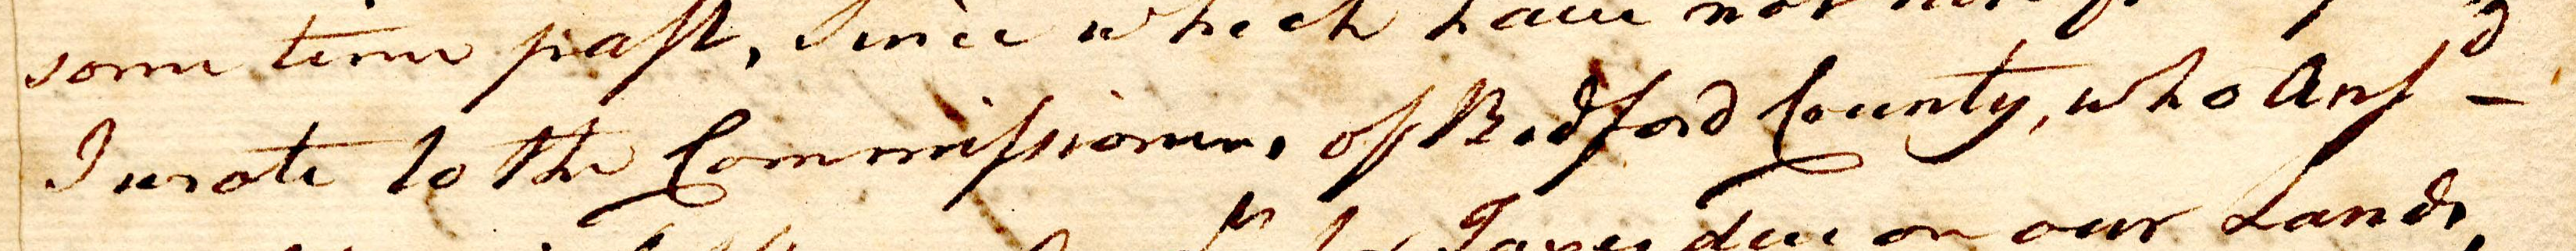I wrote to the Commissioners of Bedford County, who ans^d
